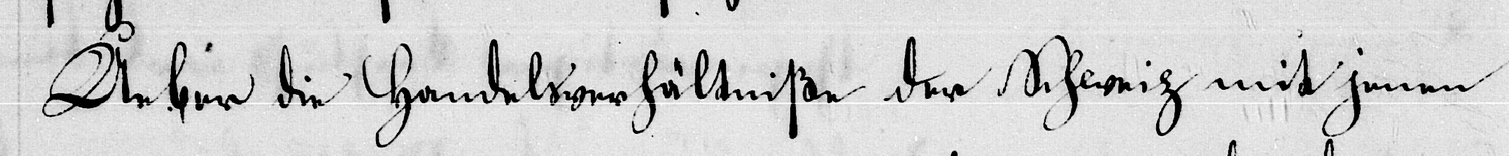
Ueber die Handelsverhältniße der Schweiz mit jenen
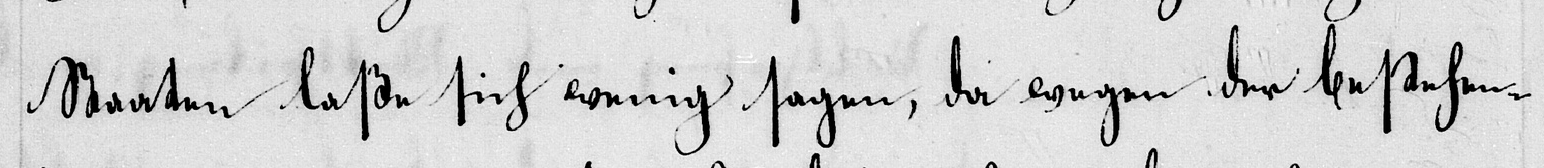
Staaten laße sich wenig sagen, da wegen der bestehen¬
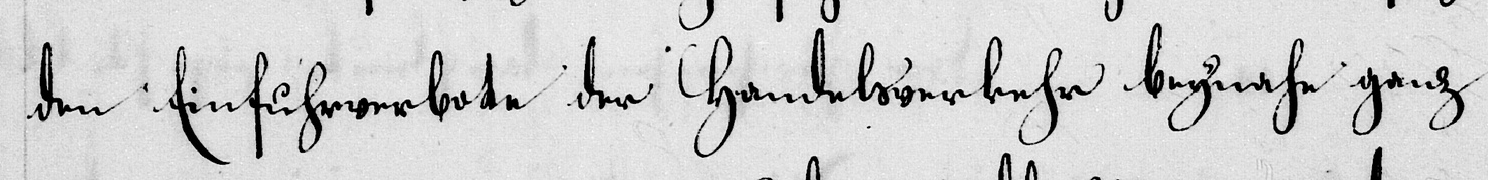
den Einfuhrverbote der Handelsverkehr beynahe ganz
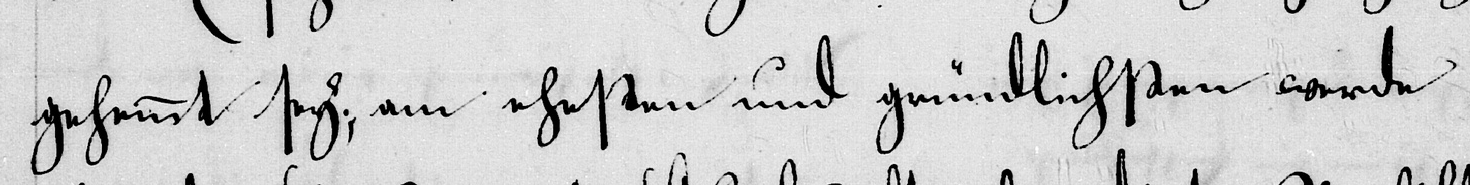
gehemmt sey; am ehesten und gründlichsten werde
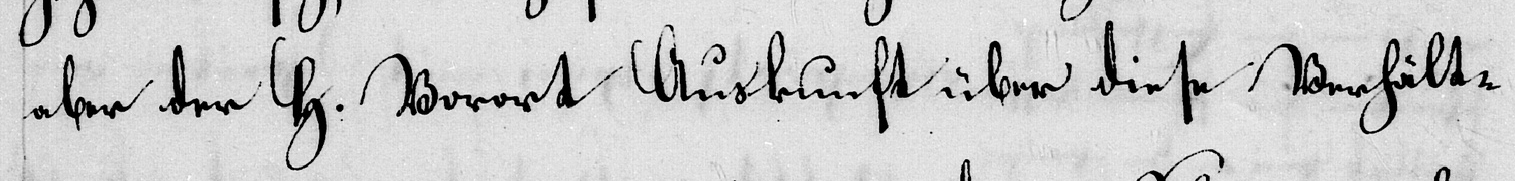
aber der H. Vorort Auskunft über diese Verhält¬
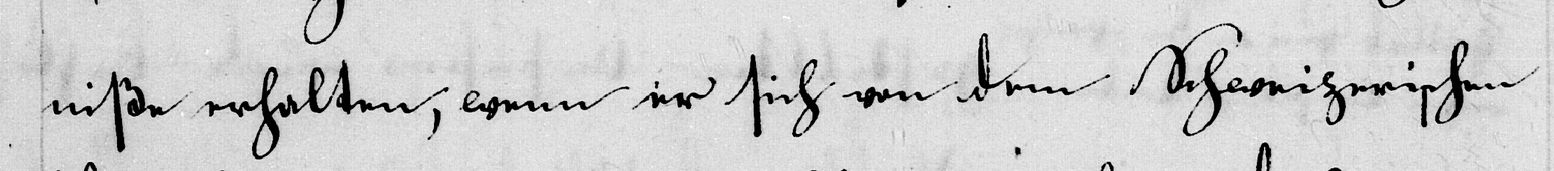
niße erhalten, wenn er sich von dem Schweizerischen
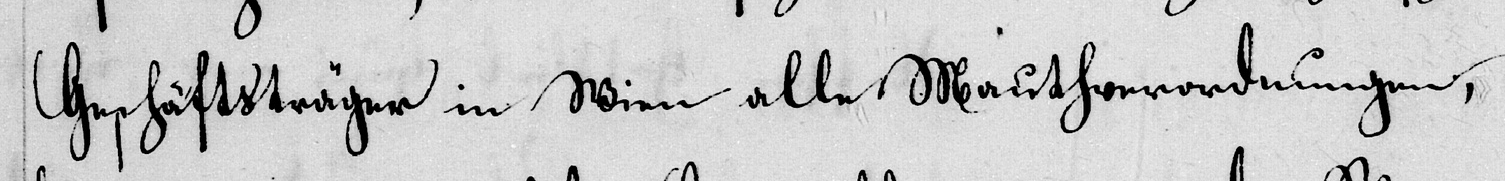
Geschäftsträger in Wien alle Mauthverordnungen,
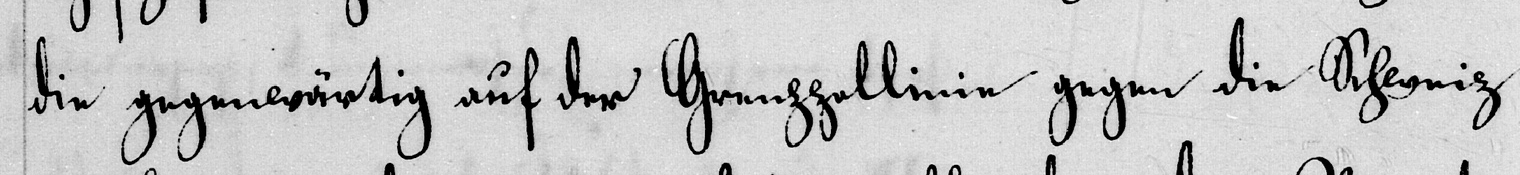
die gegenwärtig auf der Grenzzollinie gegen die Schweiz
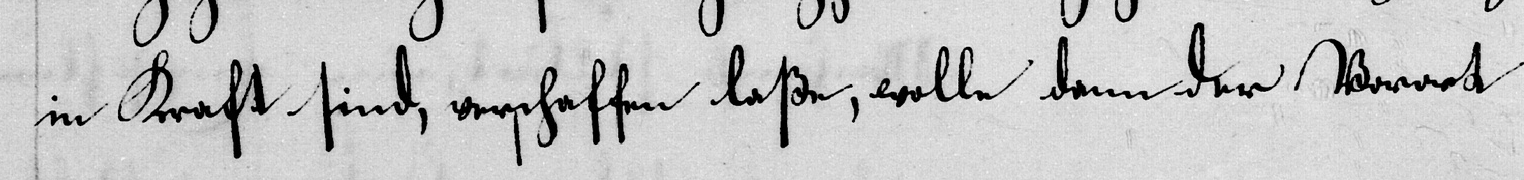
in Kraft sind, verschaffen laße, wolle dann der Vorort
